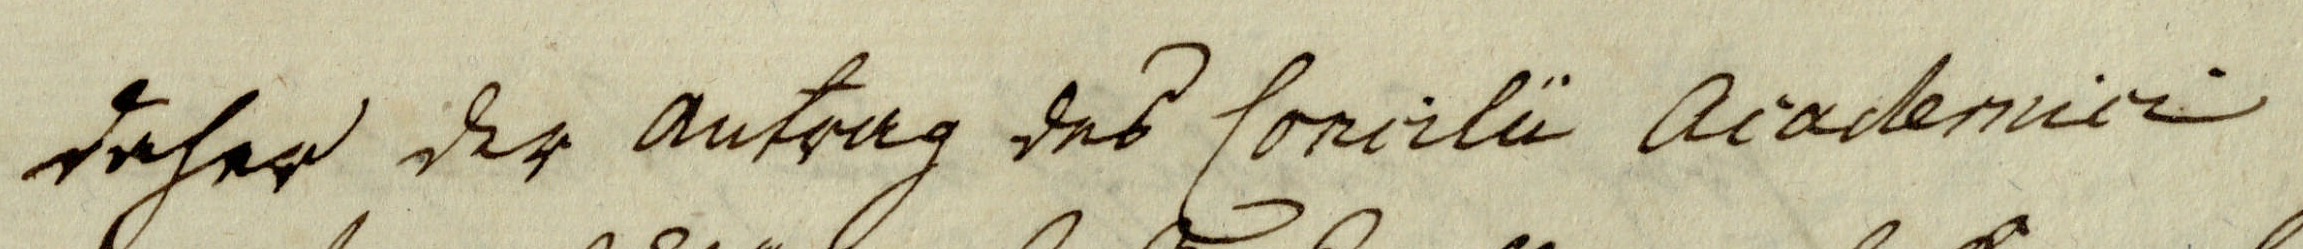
daher der Antrag des Concilii Academici
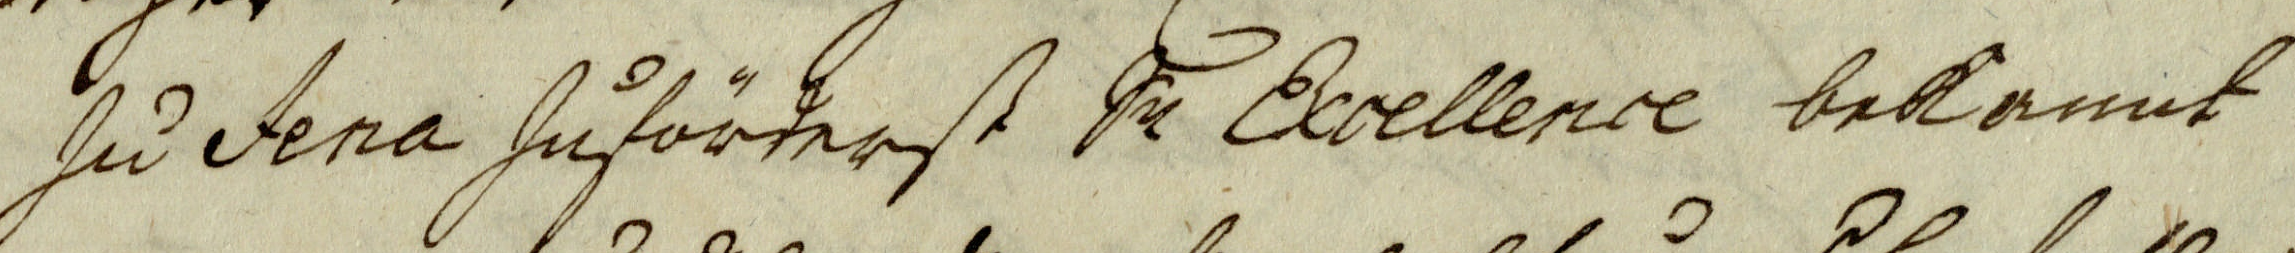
zu Jena zuförderst Sr. Excellence bekannt
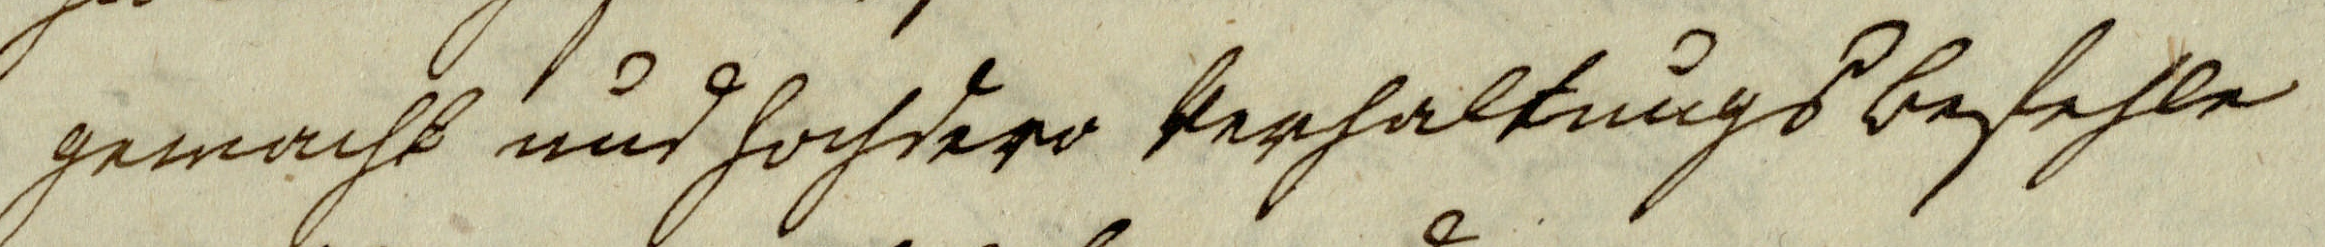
gemacht und hochdero Verhaltungs Befehle
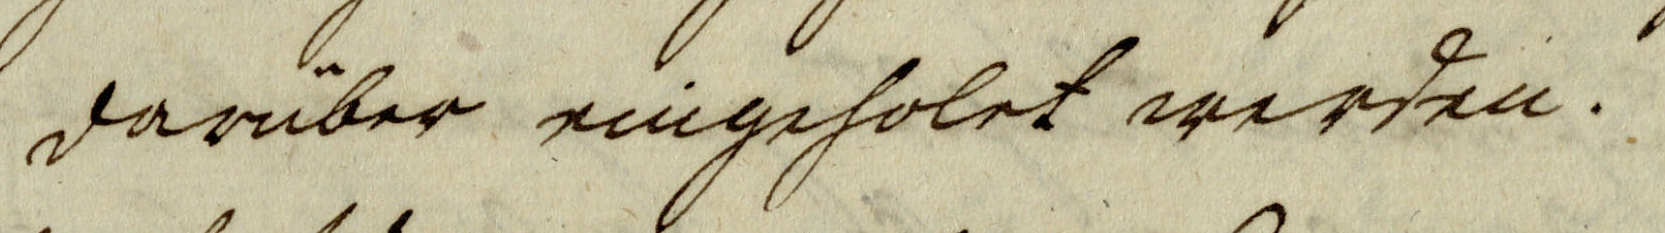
darüber eingeholet werden.
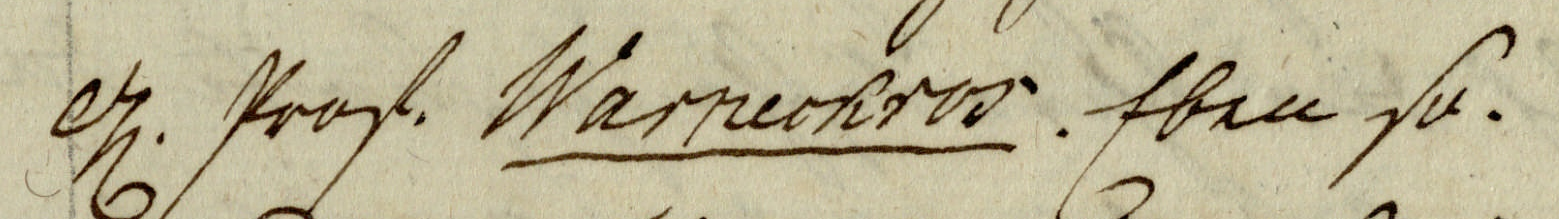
dh. Prof. Warneckros. Eben so.
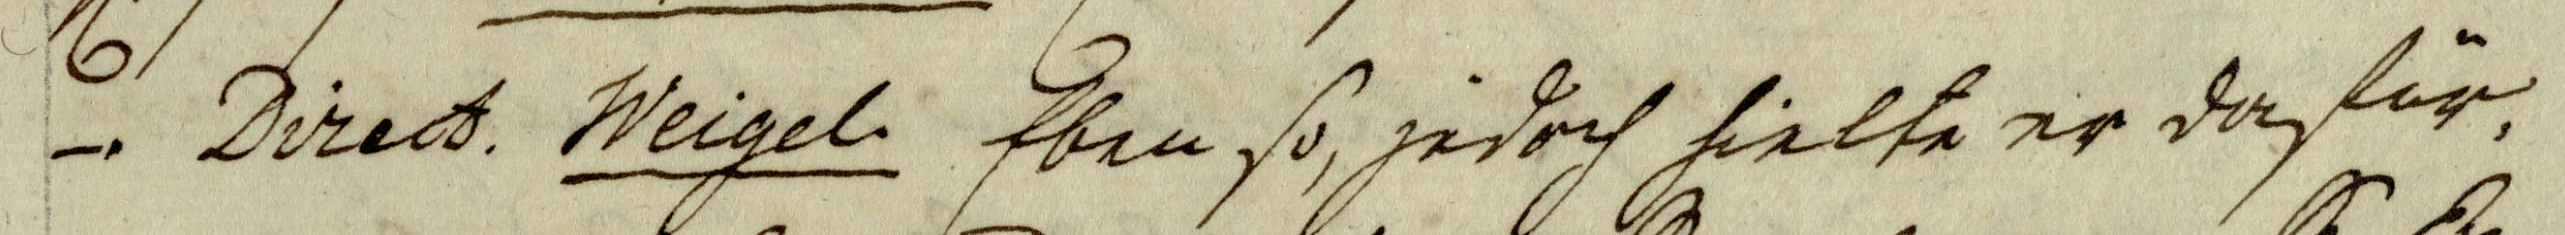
— " Direct. Weigel. Eben so, jedoch hielte er dafür,
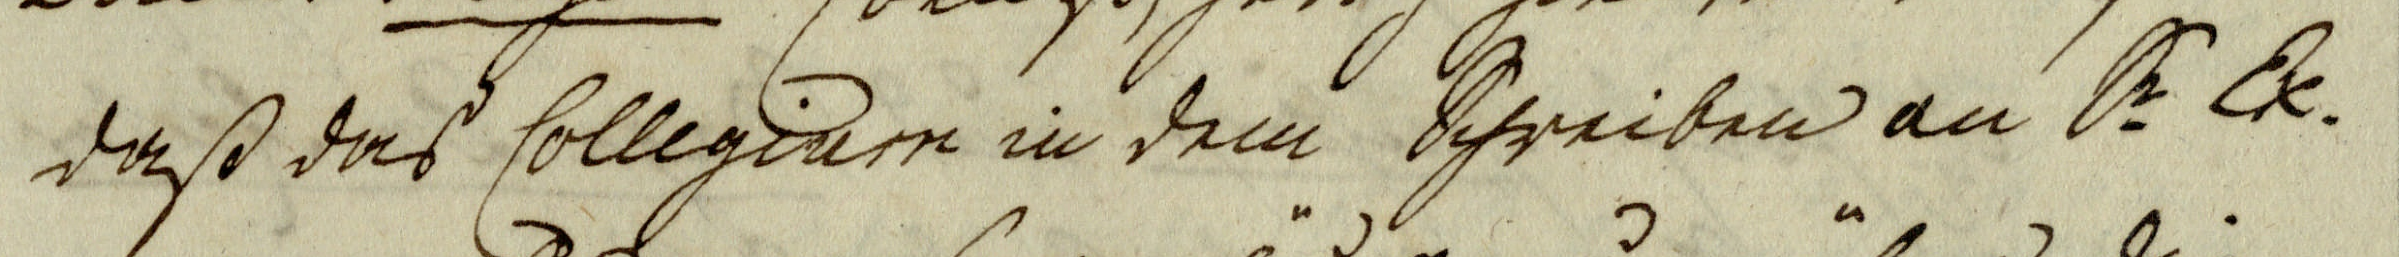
daß das Collegium in dem Schreiben an Sr. Ex¬
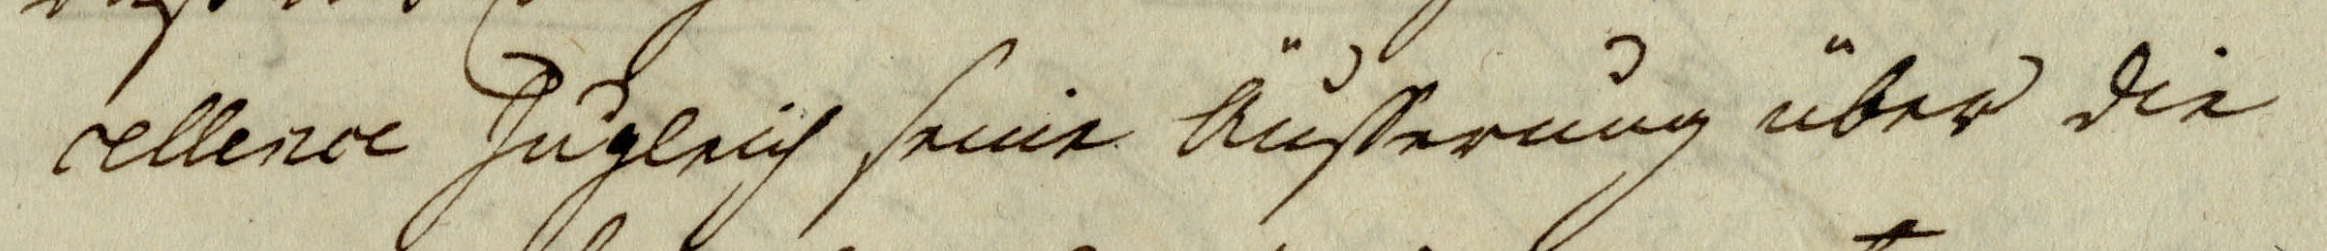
cellence zugleich seine Äusserung über die
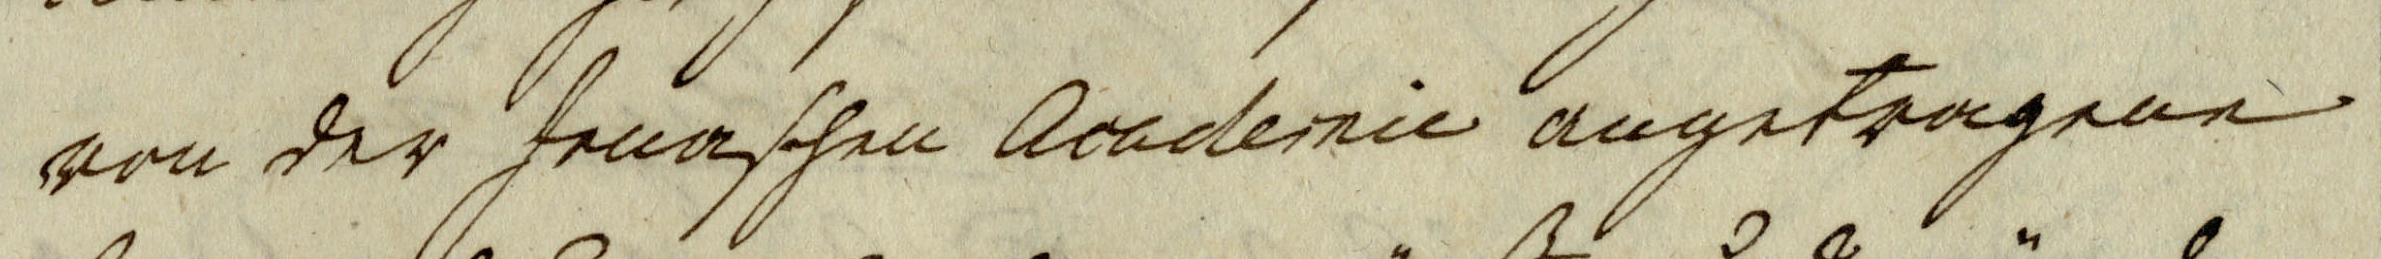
von der Jenaschen Academie angetragene
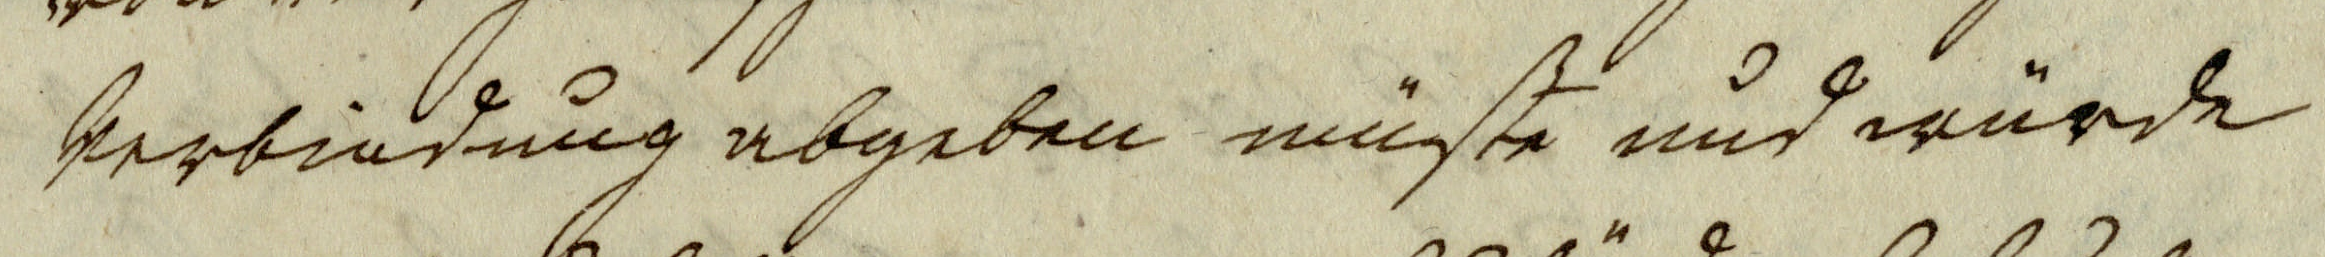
Verbindung abgeben müsste und würde
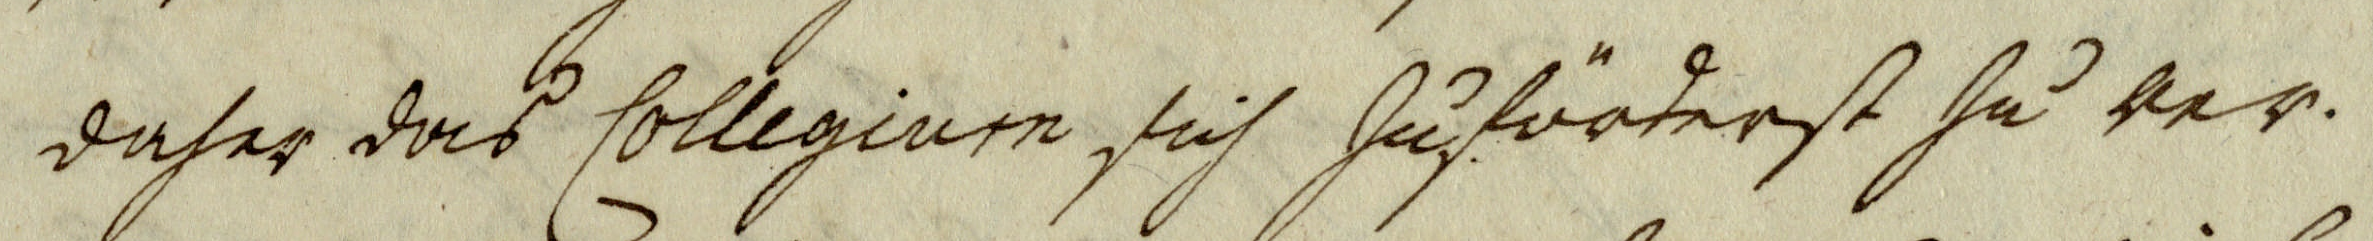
daher das Collegium sich zuförderst zu ver¬
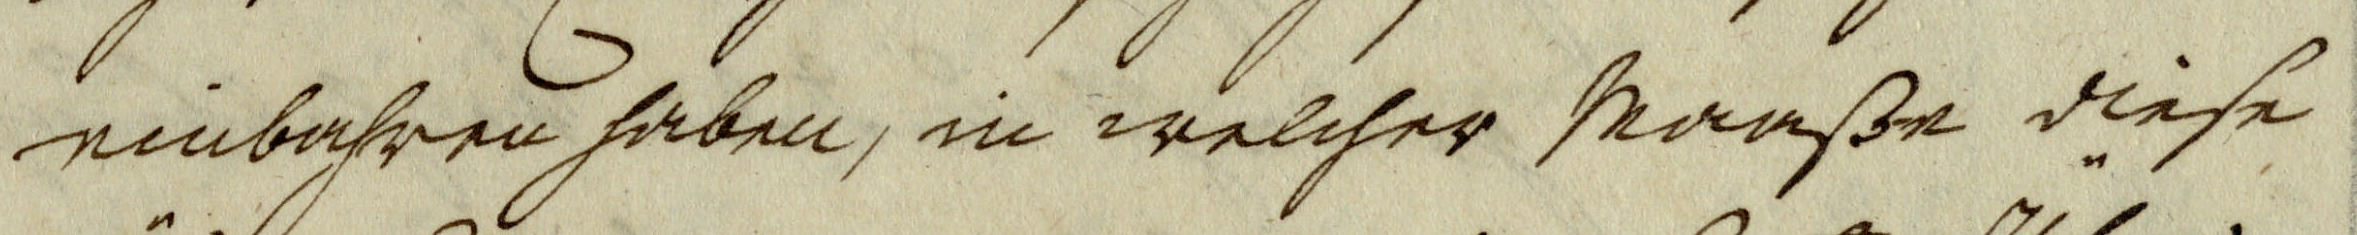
einbahren haben, in welcher Maaße diese
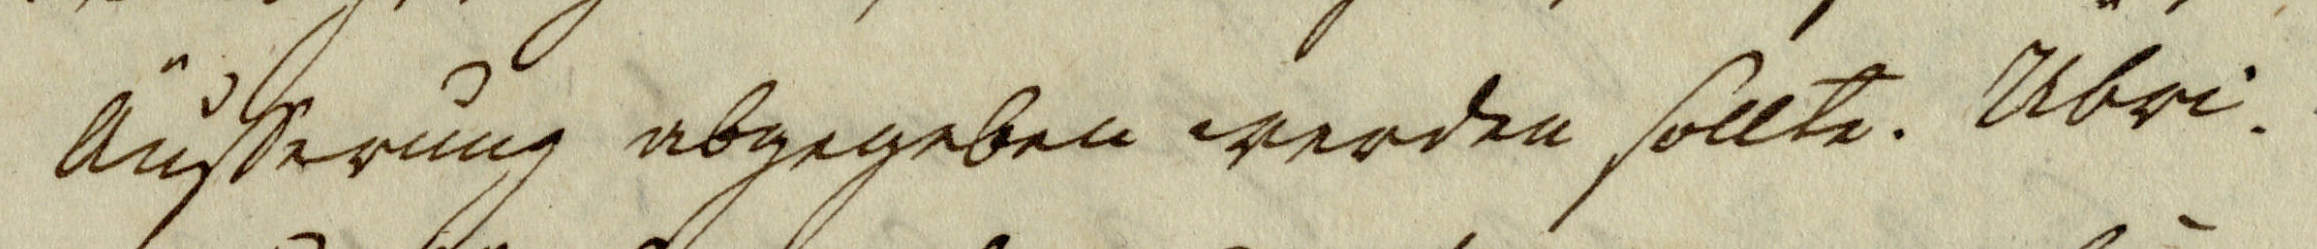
Äusserung abgegeben werden sollte. Übri¬
